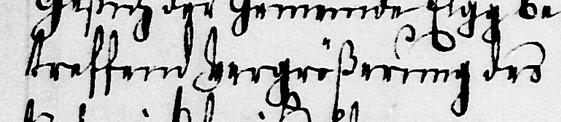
treffend Vergrößerung des
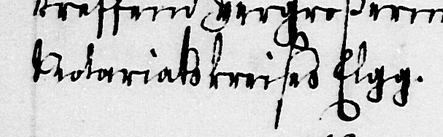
Notariatskreises Elgg.
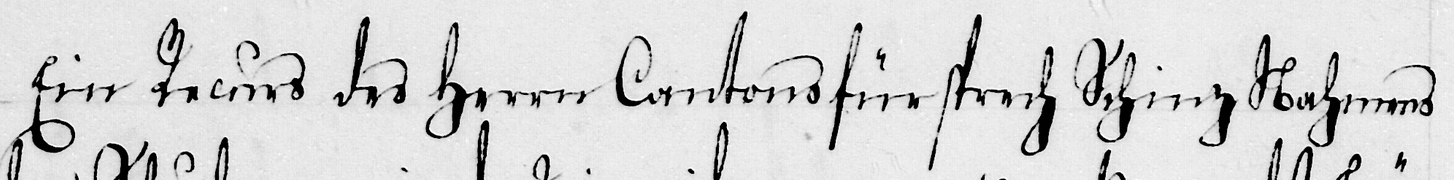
Ein Recurs des Herrn Cantonsfürsprech Schinz Nahmens
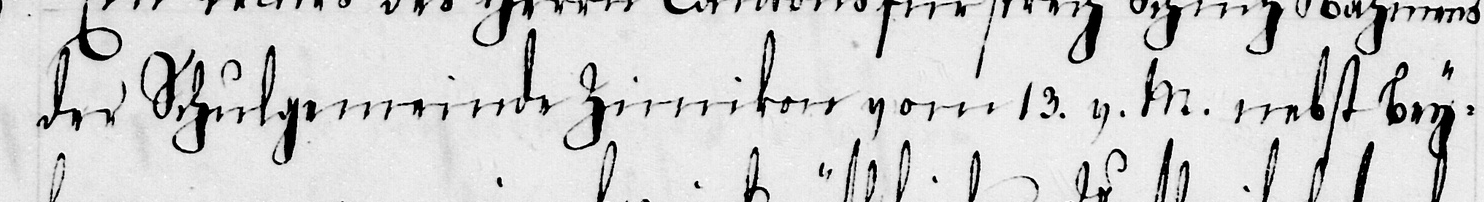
der Schulgemeinde Zimikon vom 13. v. M. nebst Bey¬
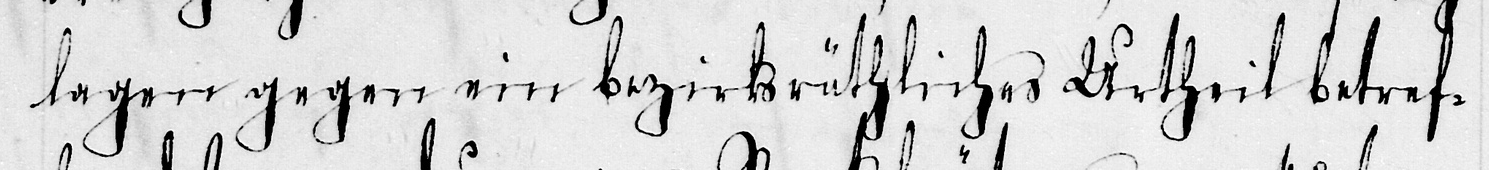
lagen gegen ein bezirksräthliches Urtheil betref¬
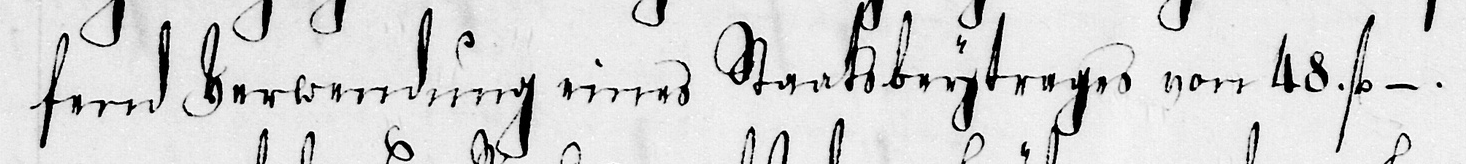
fend Verwendung eines Staatsbeytrages von 48. fl – .
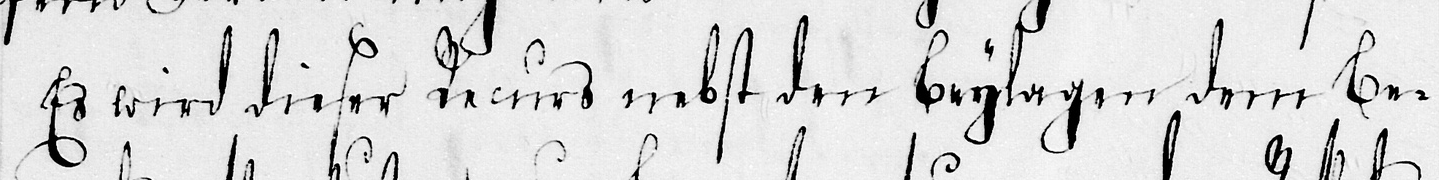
Es wird dieser Recurs nebst den Beylagen dem Be¬
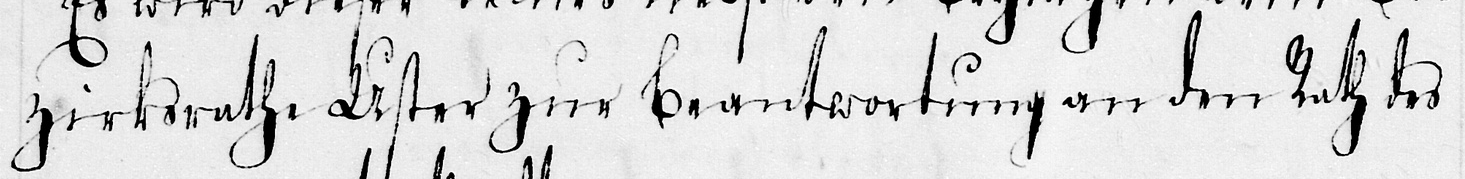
zirksrathe Uster zur Beantwortung an den Rath des
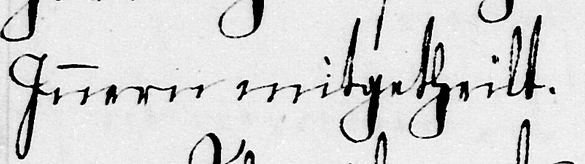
Innern mitgetheilt.
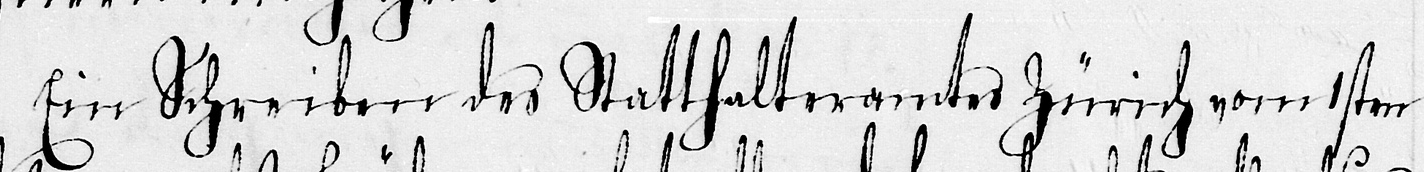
Ein Schreiben des Statthalteramtes Zürich vom 1sten
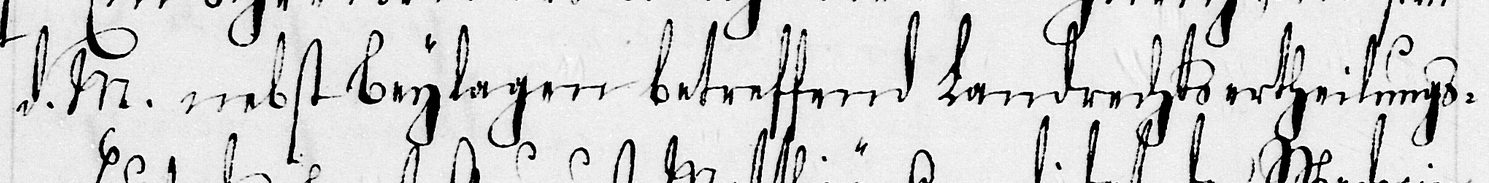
d. M. nebst Beylagen betreffend Landrechtsertheilungs¬
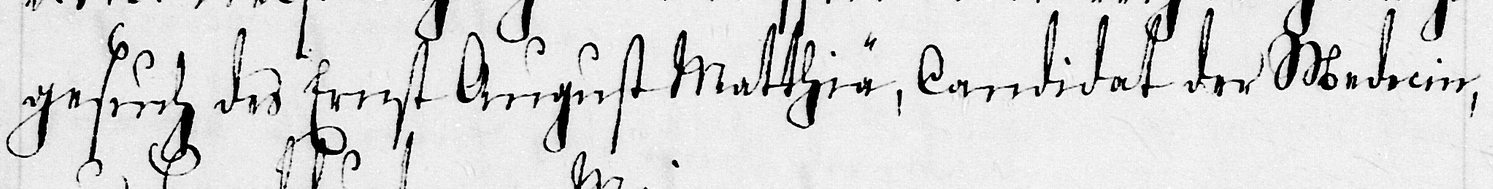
gesuch des Ernst August Matthiä, Candidat der Medecin,
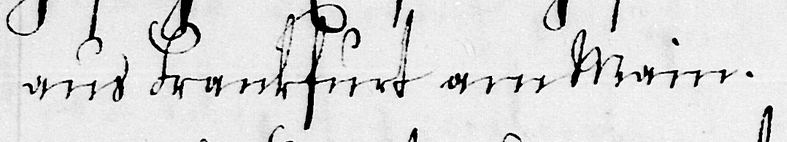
aus Frankfurt am Main.
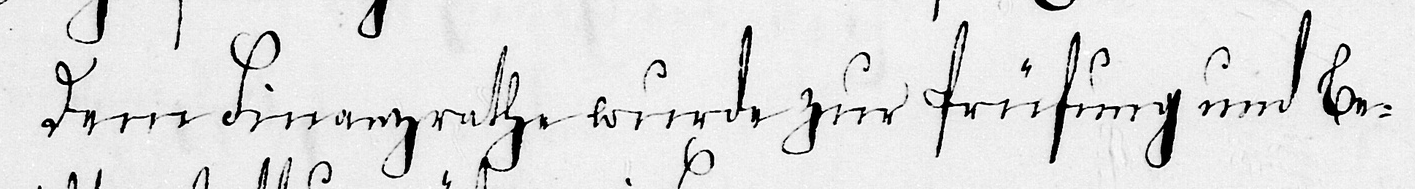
Dem Finanzrathe wurde zur Prüfung und Be¬
